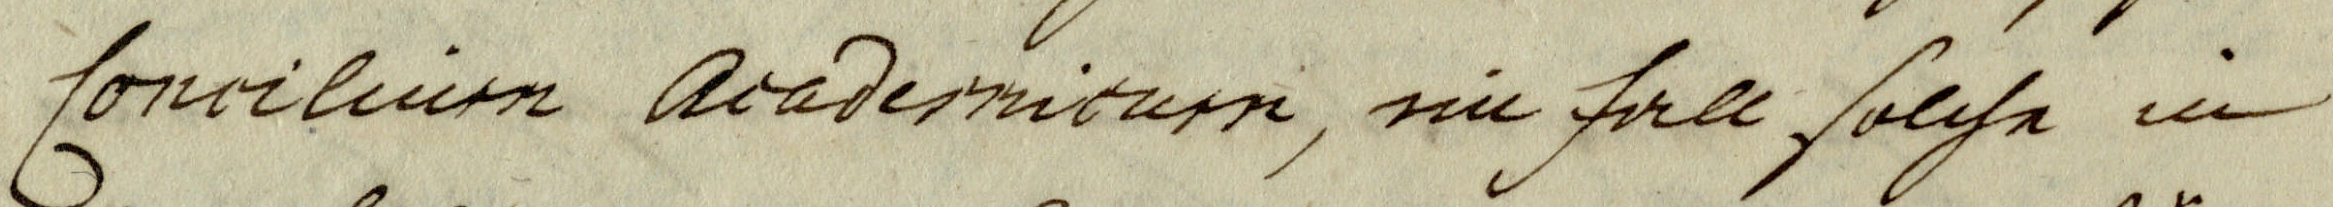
Concilium Academicum, im Fall solche in
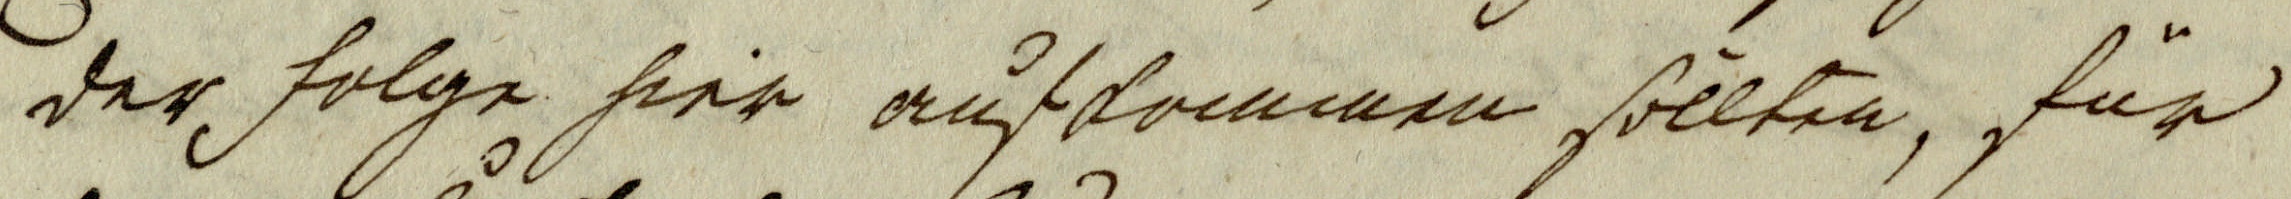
der Folge hier aufkommen sollten, für
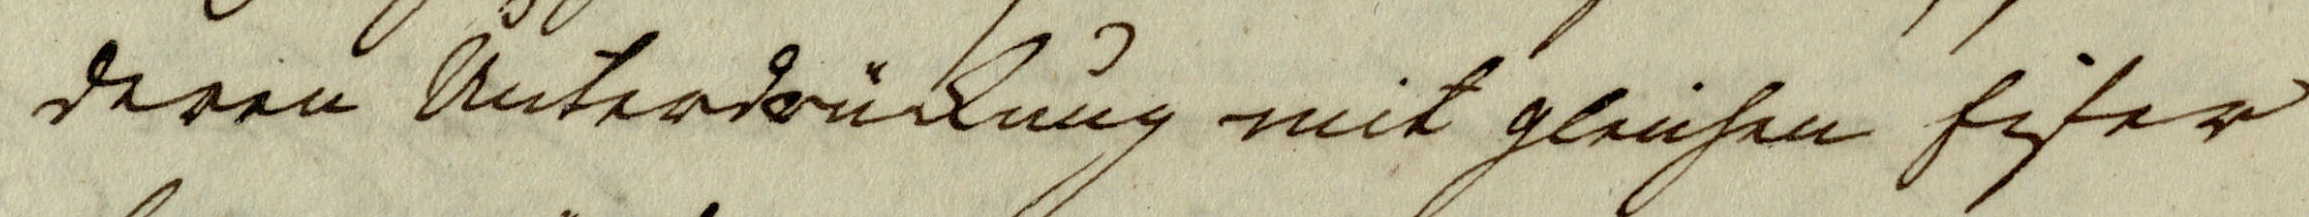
deren Unterdrückung mit gleichen Eifer
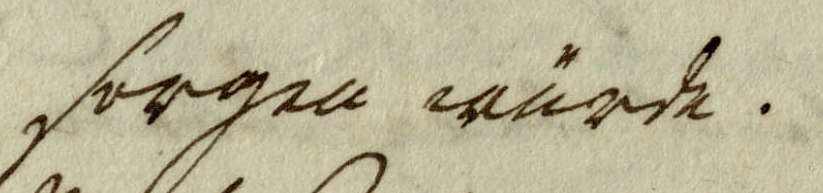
sorgen würde.
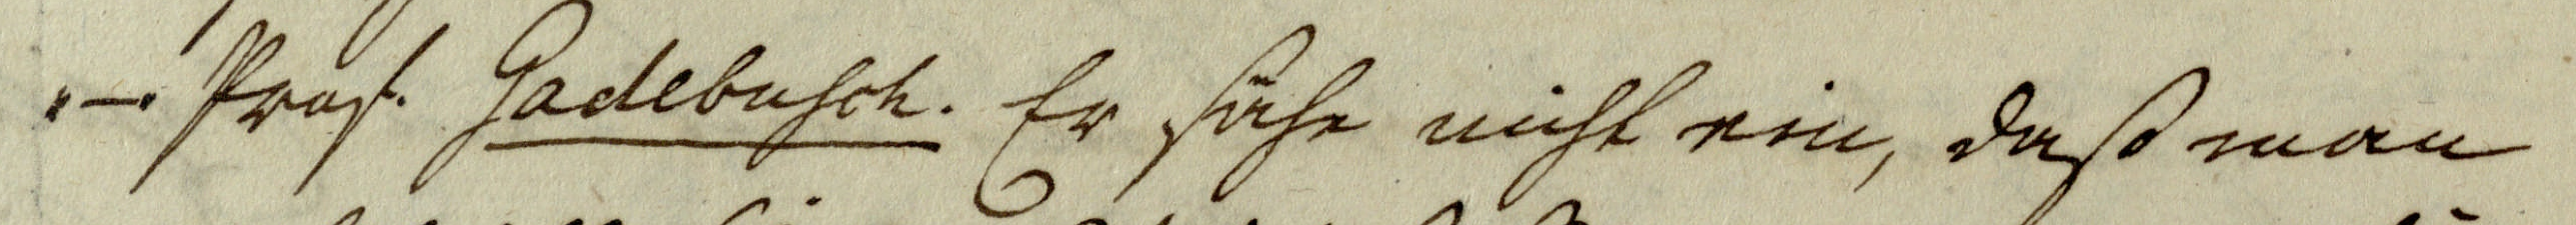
" — " Prof. Gadebusch. Er sähe nicht ein, daß man
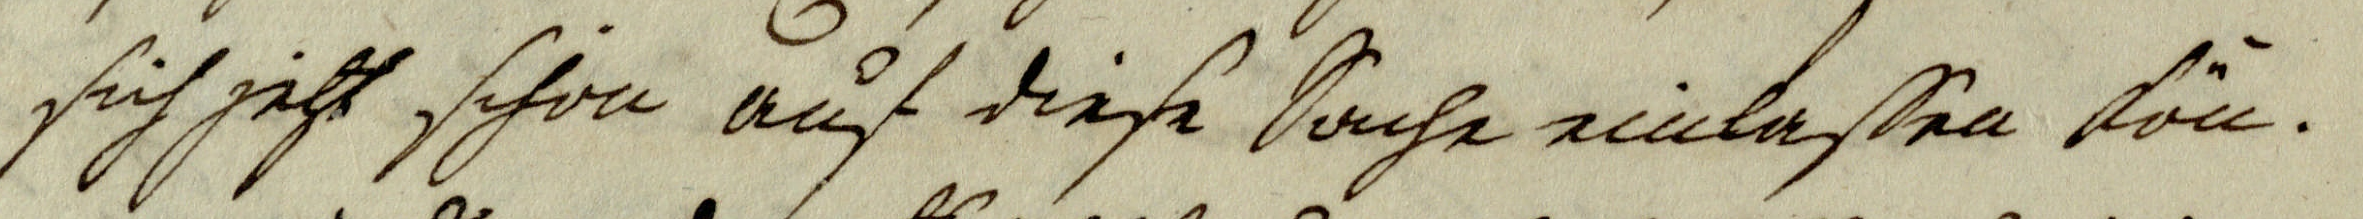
sich jetzt schon auf diese Sache einlassen kön¬
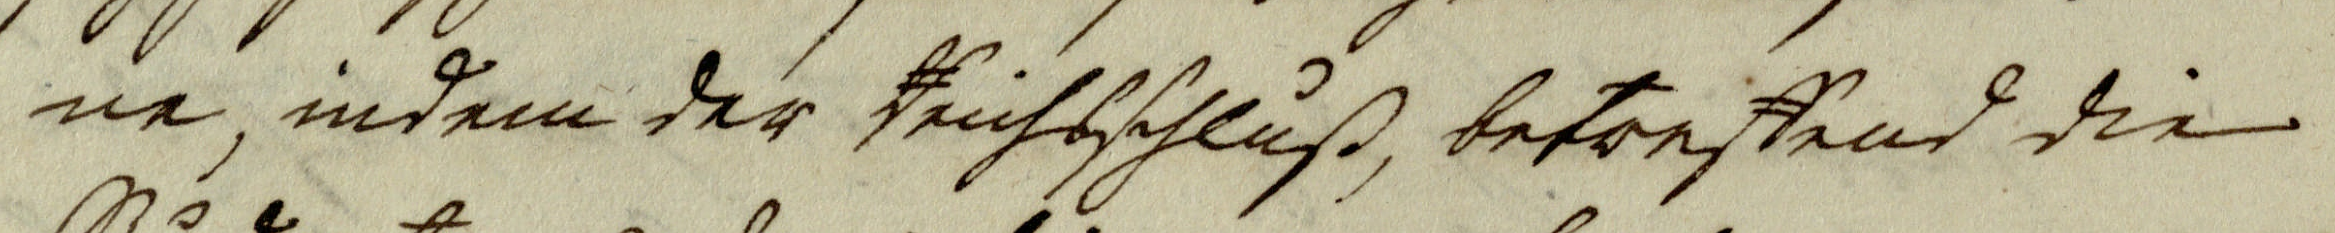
ne, indem der Reichsschluß, betreffend die
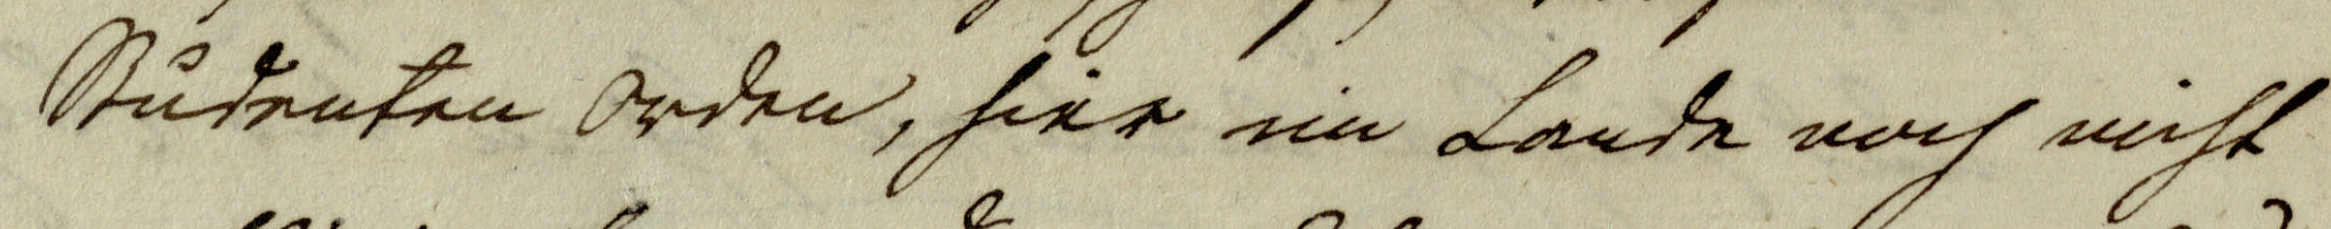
Studenten Orden, hier im Lande noch nicht
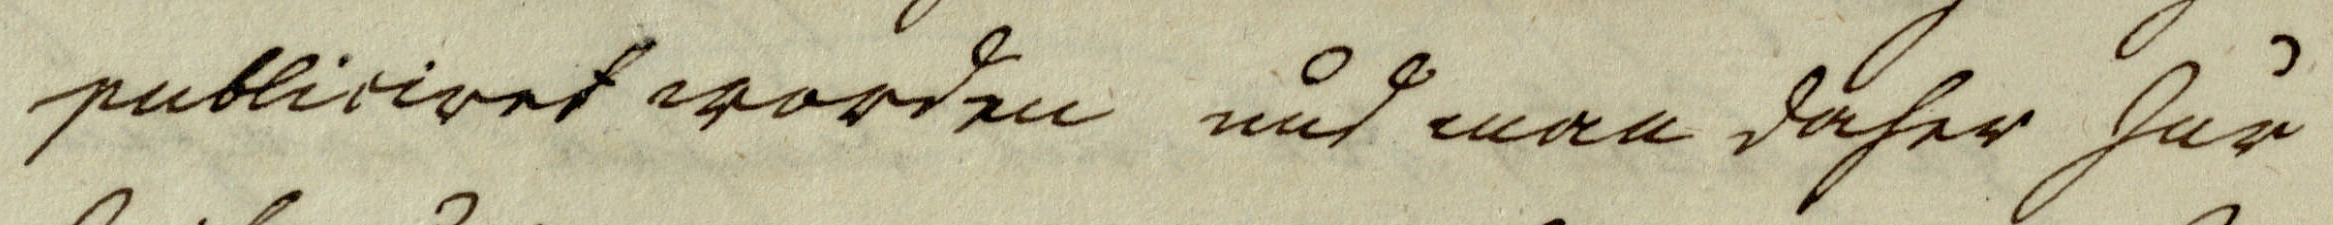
publiciret worden und man daher zur
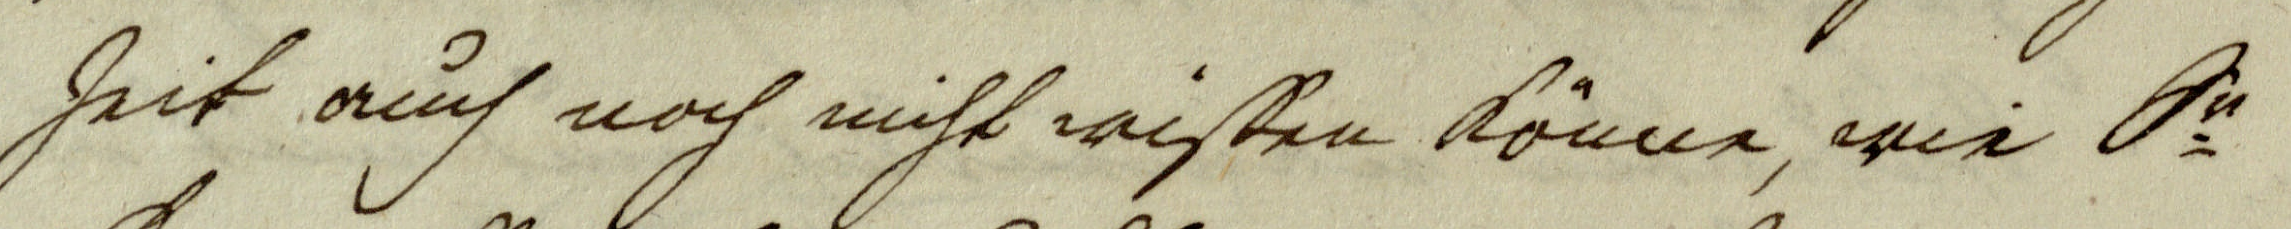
Zeit auch noch nicht wissen könne, wie Sr.
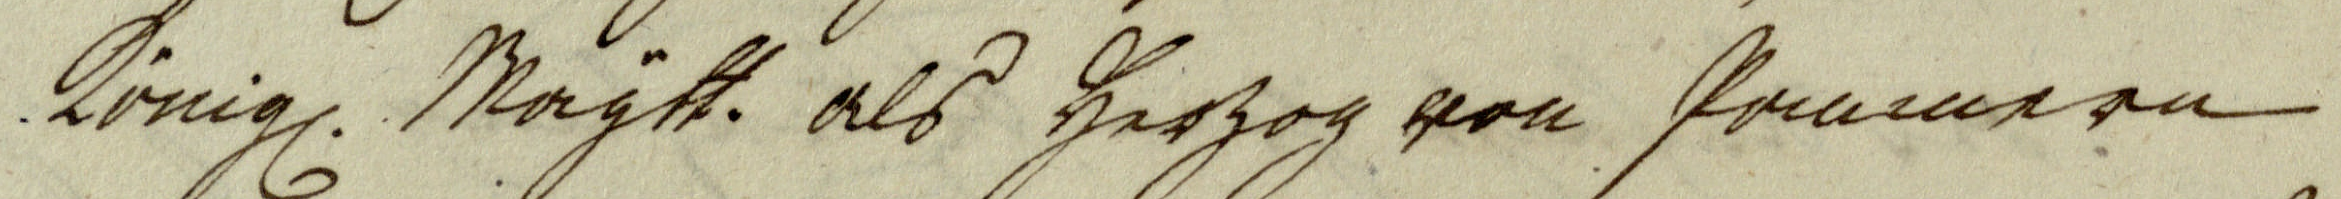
Königl. Maÿst. als Herzog von Pommern
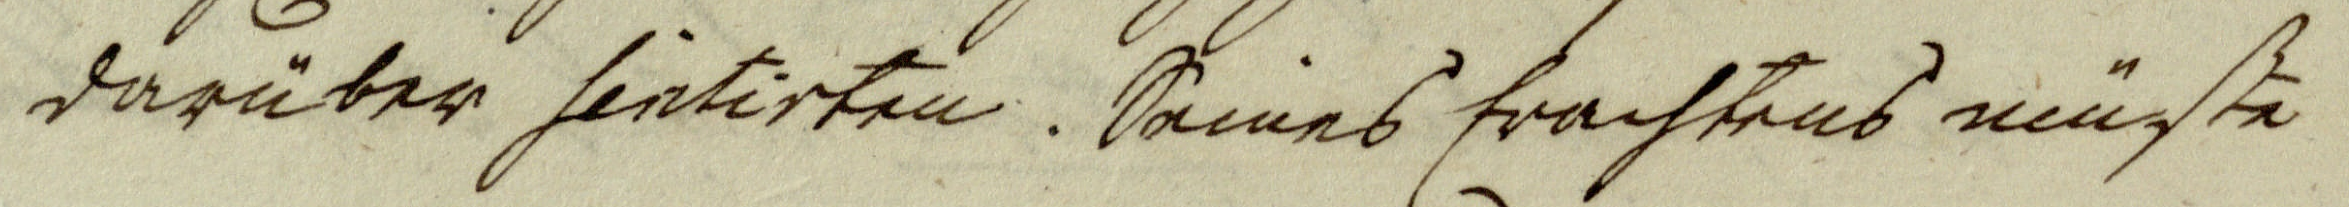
darüber sentirten. Seines Erachtens müsste
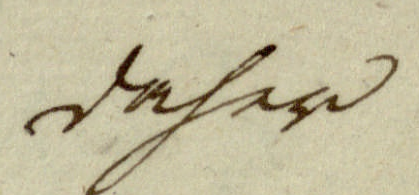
daher
